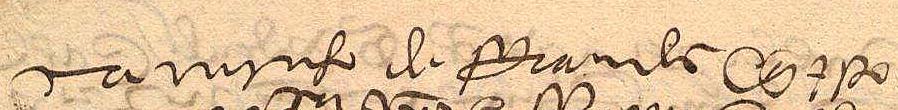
camjnho de frandes e q̄ jsto
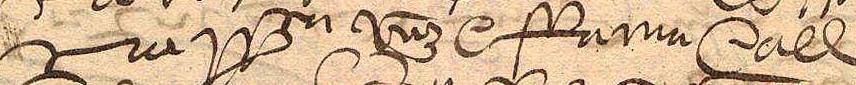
era ꝓpca voz e fama e all
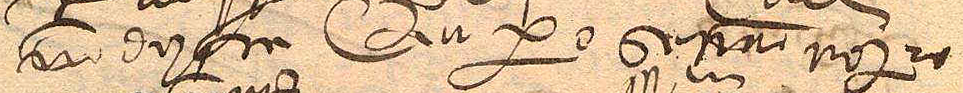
nō dyse E eu ꝑo serrão notro
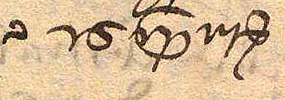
o escp̄uj
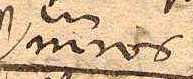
m̄cos
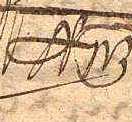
ffr̄rz
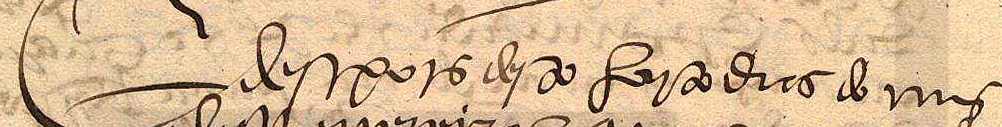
E despojs desto hoyto dias do mes
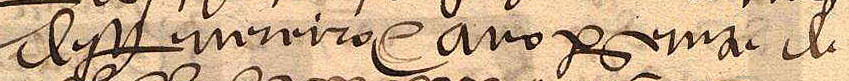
de feuereiro e ano ꝑsemte de
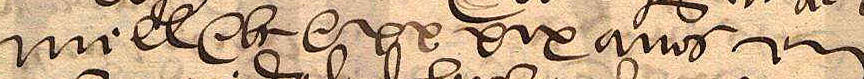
mill e bc e xxxix anos em
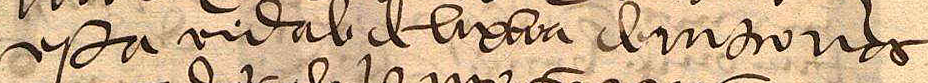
esta cidade de lixboa demtro nas
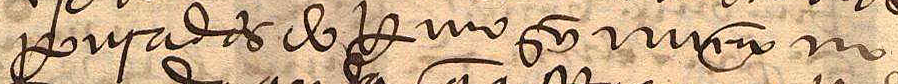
pousadas do Rmo sōr nucio no
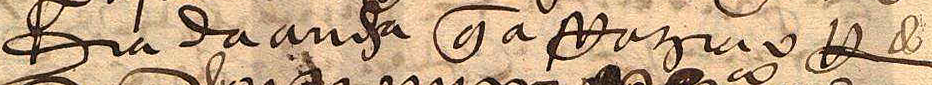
dia da audja q̄ a ffazia o Rdo
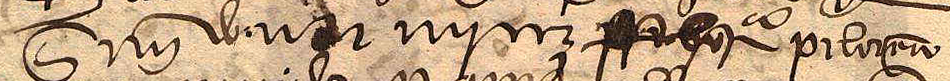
Snor̄ doutor mjcer ffrrco pilorcio
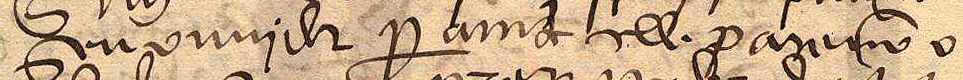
seu ouujdor ꝑamte elle pareceo o
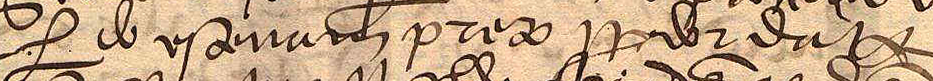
Ldo esteuam preto ꝓdor da Re
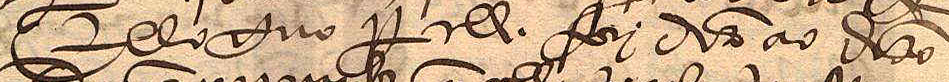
E lloguo ꝑ elle foy dito ao dito
